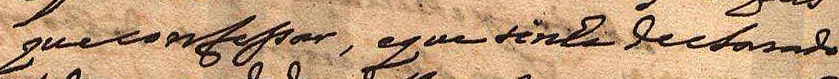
que confessar, e que tinha declarado
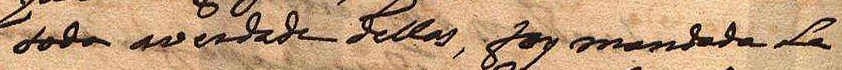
toda a verdade dellas, foy mandada Le
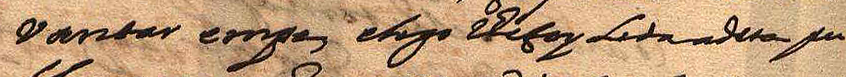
vantar em pe, e logo lhe foy Lida a dita pu
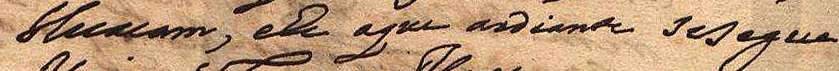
blicaçam, e he a que ao diante se segue
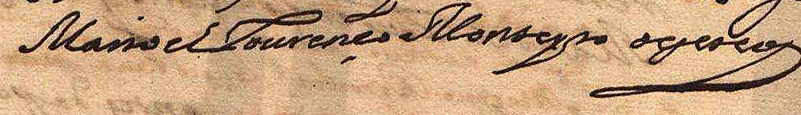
Manoel Lourenço Monteyro o escrevj
